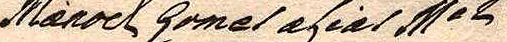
Manoel Gomes alias Mel
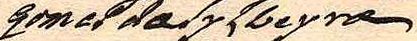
Gomes da Sylveyra
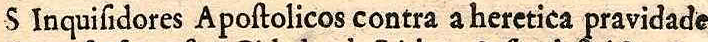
S Inquisidores Apostolicos contra a heretica pravidade,
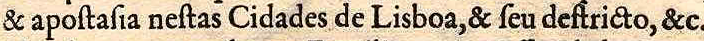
& apostasia nestas Cidades de Lisboa, & seu destricto, &c.
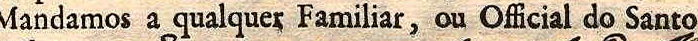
Mandamos a qualquer Familiar , ou Official do Santo
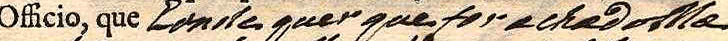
Officio, que donde quer que for achado Ma
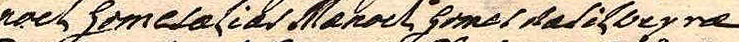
noel Gomes alias Manoel Gomes da Silveyra
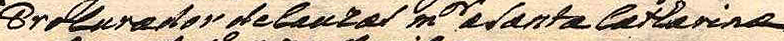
Procurador de Couzas m.or a Santa Catharina
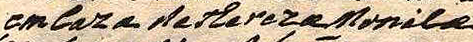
em Caza da Thereza Monica
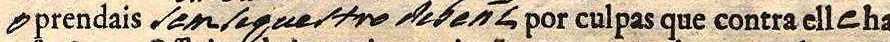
o prendais sem sequestro de ben̄z por culpas que contra elle ha
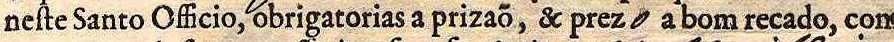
neste Santo Officio, obrigatorias a prizaõ, & prezo a bom recado, com
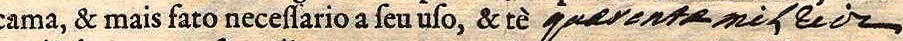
cama, & mais fato necessario a seu uso, & tè quarenta mil reiz
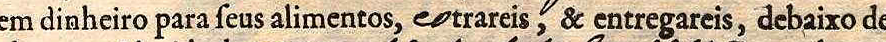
em dinheiro para seus alimentos, e o trareis, & entregareis, debaixo de
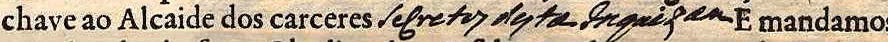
chave ao Alcaide dos carceres secretos desta Inquiçam E mandamos
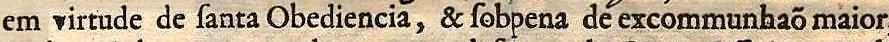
em virtude de santa Obediencia, & sobpena de excommunhaõ maior,
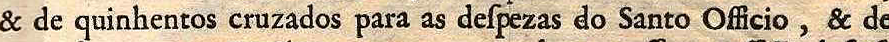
& de quinhentos cruzados para as despezas do Santo Officio , & de
